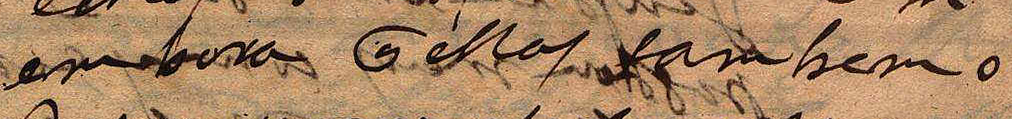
embora q̄ ellas tambem o
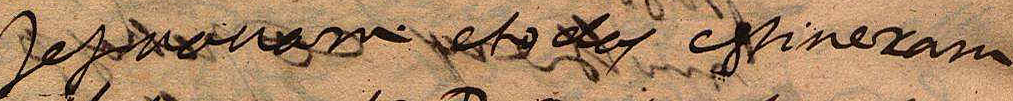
Jejuauam e todas estiueram
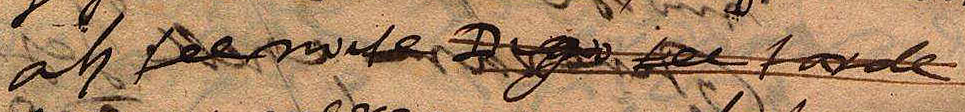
alj tee noite Digo tee tarde
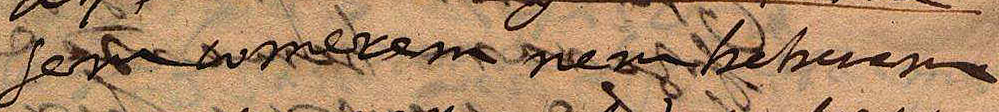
sem comerem nem beberem
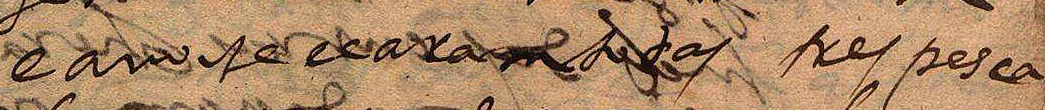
e a noite cearam todas tres pesca
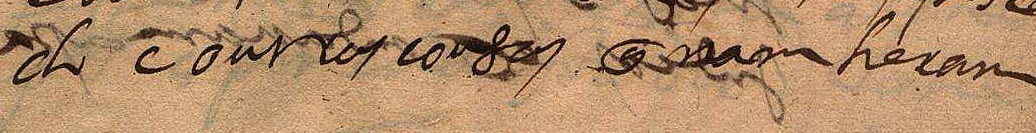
do ē outras cousas q̄ nam heram
